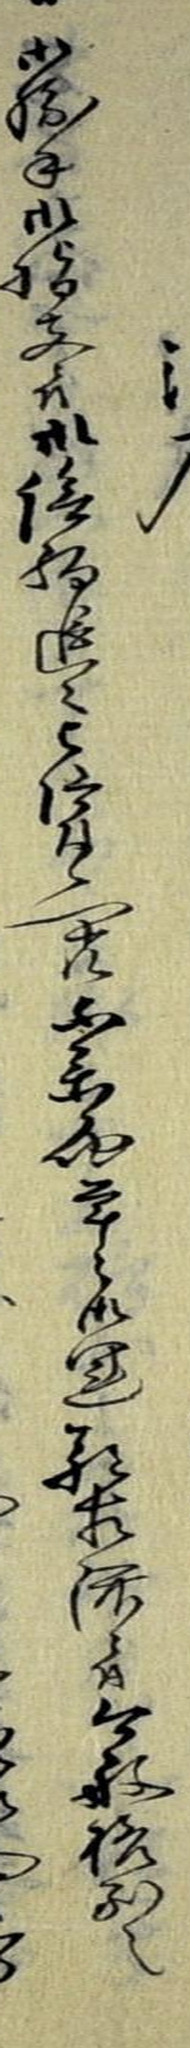〇御勝手御指支に付御倹約追々被仰付候へ共不参届年々御運難相済に付今般格別之
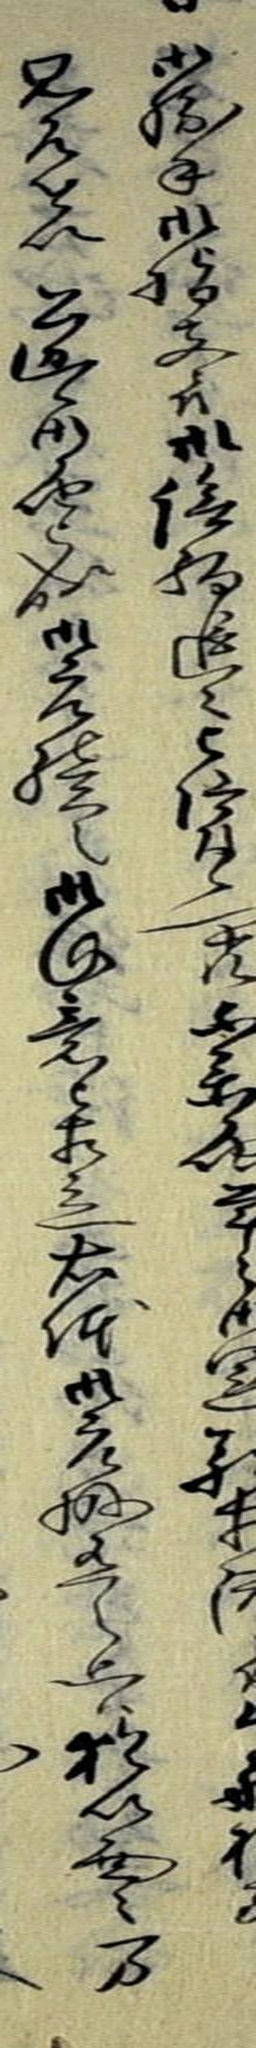思召を以公辺へ御届被成御取続之御趣意被相立右体御取扱有之上は猶以面々万
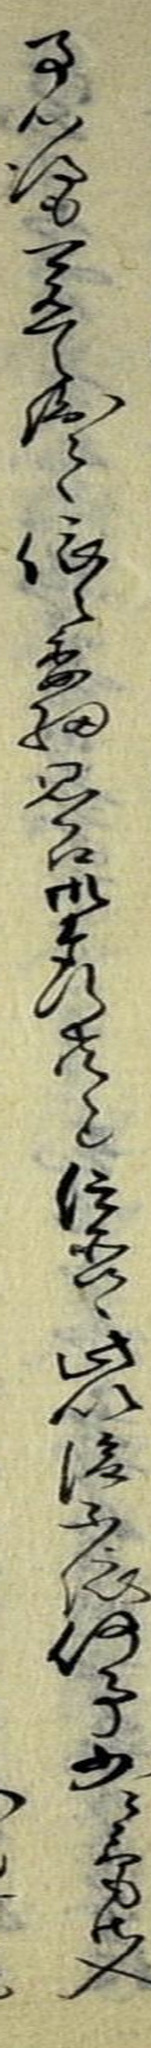事心得も可有之儀に候依之委細思召御奉行共へ被仰含候此以後不依何事少々に而も御入
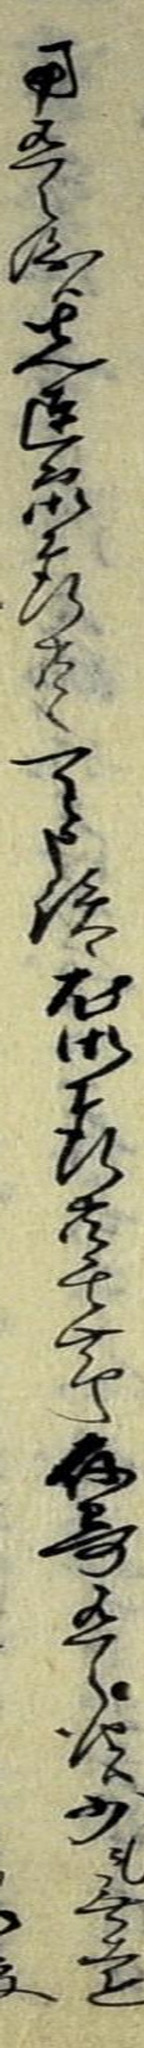用有之儀は先達而御奉行共へ可被申談候尤御奉行共其節存寄有之儀は少も無遠
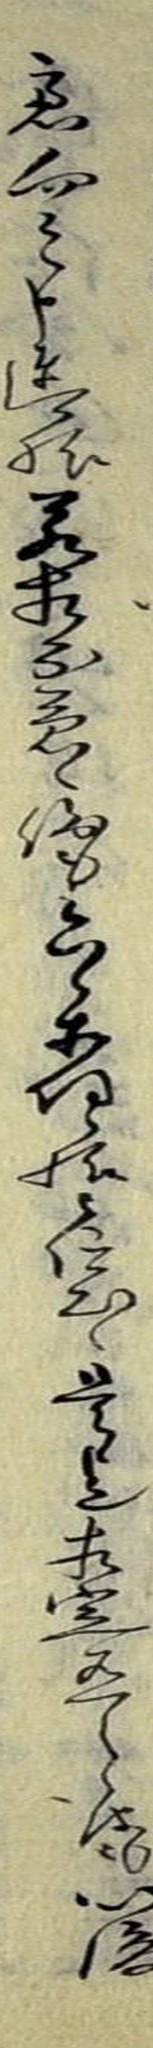慮向々へ申達候様若相分兼候儀も候はゝ相伺候様被仰出候是迄相定有之儀も以後
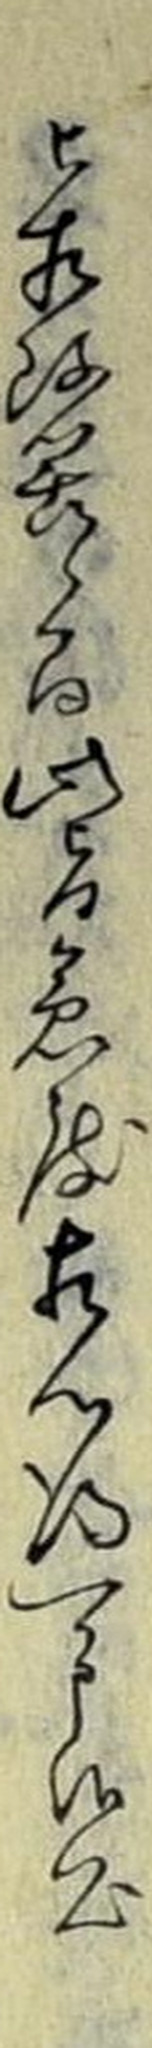被相改筈候間此旨急度相心得可申候以上
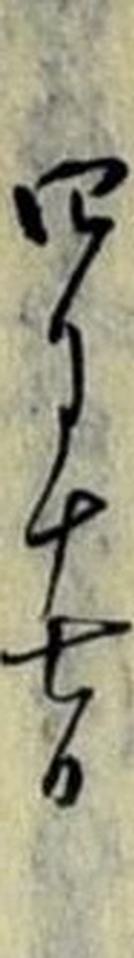四月十七日
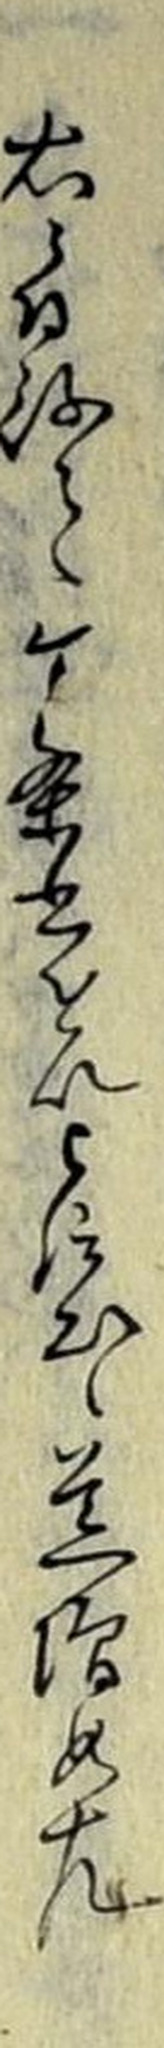右に付役々へケ条書を以被仰出候荒増如左
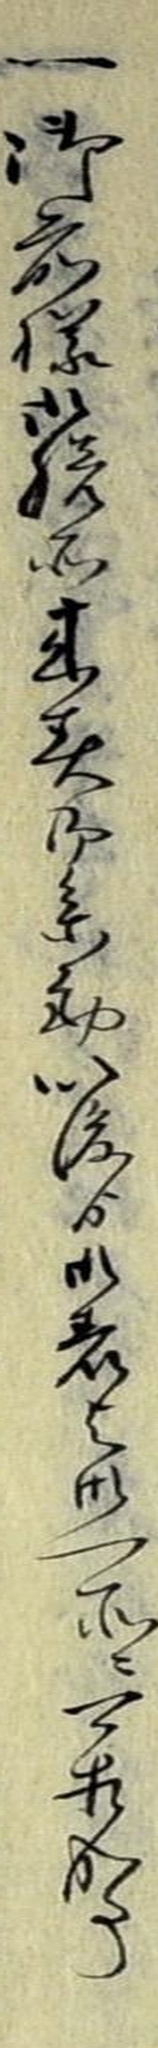一御前様御膳所来春御参勤以後ゟ御表与御一所に可相成事
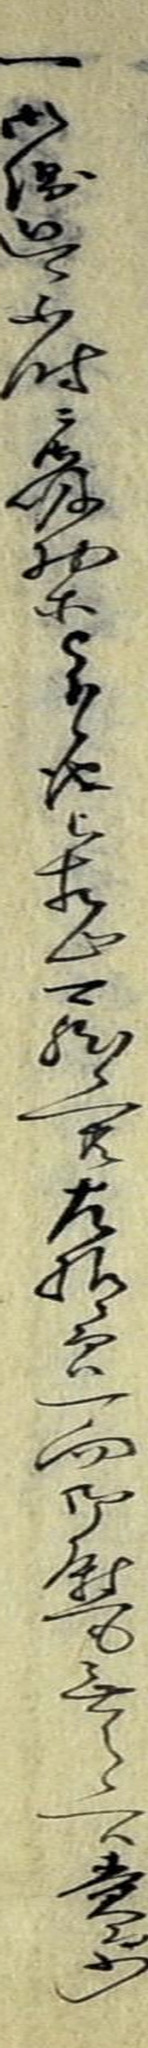一御側廻へ不時に御吸物等被下候儀被相止可然候へ共左様に而は一向御慰も無之候へは責而少
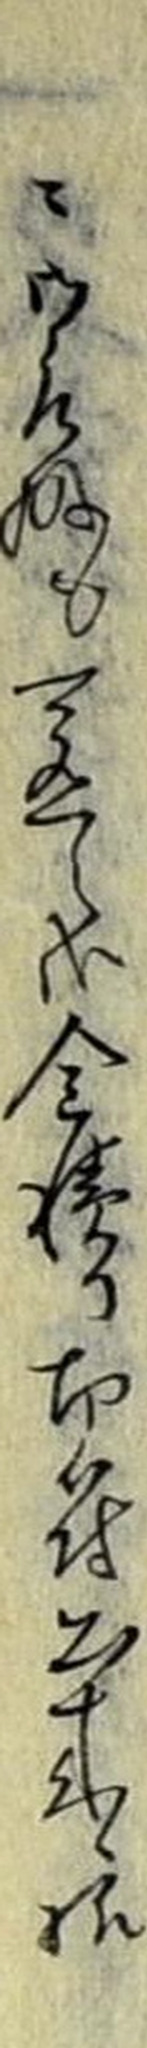々御取扱も可有之哉金積り切符出来候様
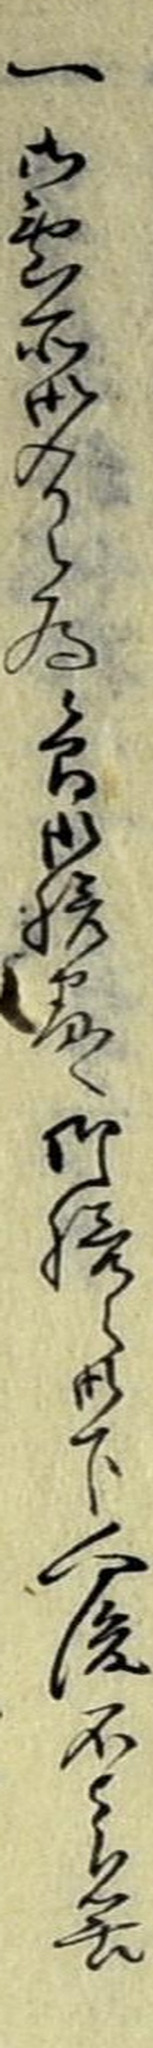一御台所御〆り之為候間御膳番へ御膳之御下向後不被下筈
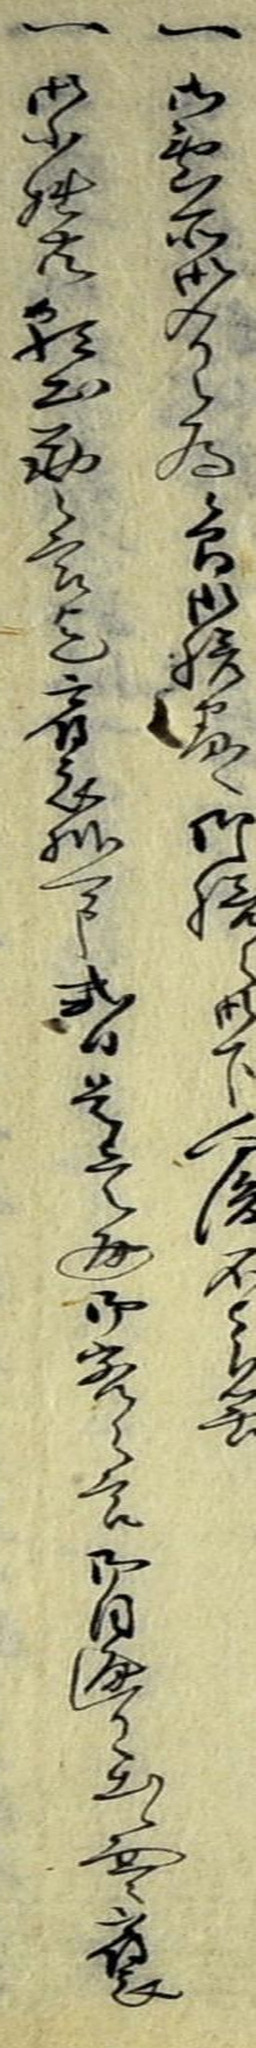一御小姓共願出勤之節迄肩衣掛可申式日是迄之通御客之節御目通りへ出候面々肩衣

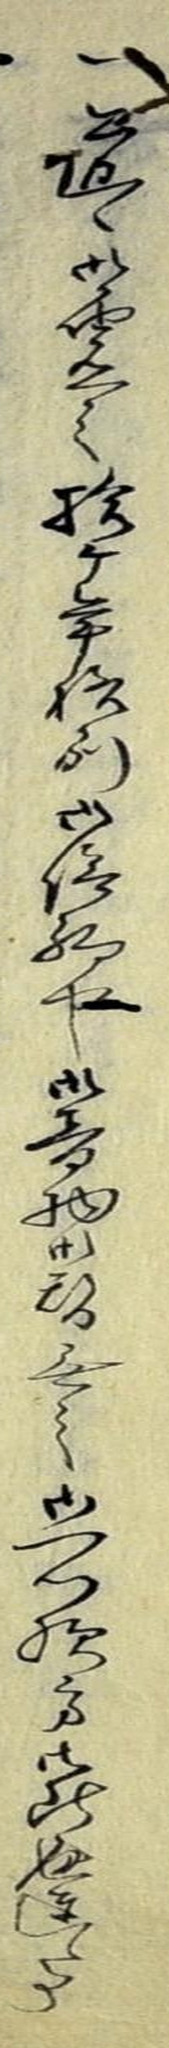一公辺へ御届有之拾ヶ年格別御倹約中御音物御替無之御一門様方御断通達之事
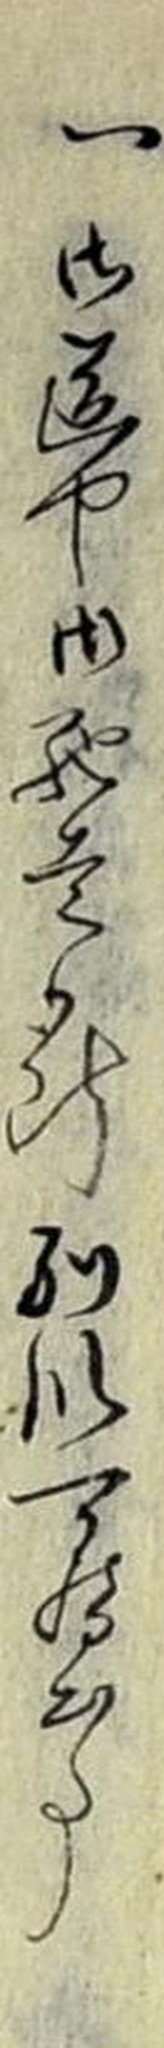一御道中御馳走同断別段可指出事
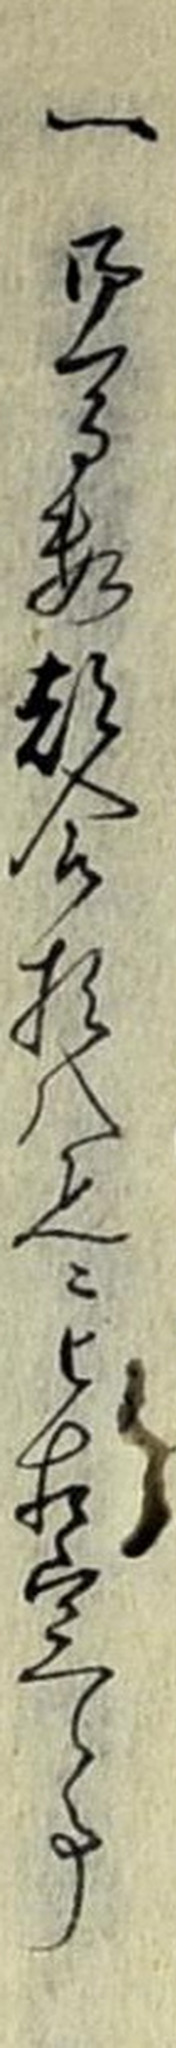一御馬数都合従拾八疋に被相定候事
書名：命令之部 二
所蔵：福井県文書館 Fukui Prefectural Archives
